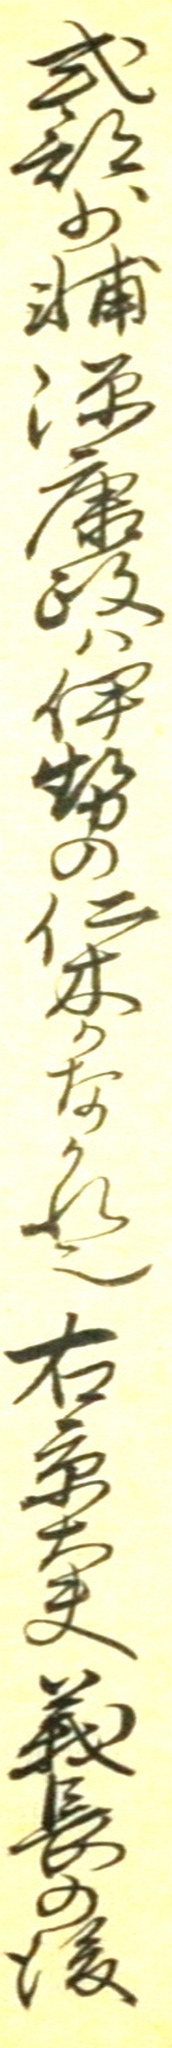式部少輔源康政は伊勢の仁木かなかれ也右京大夫義長の後
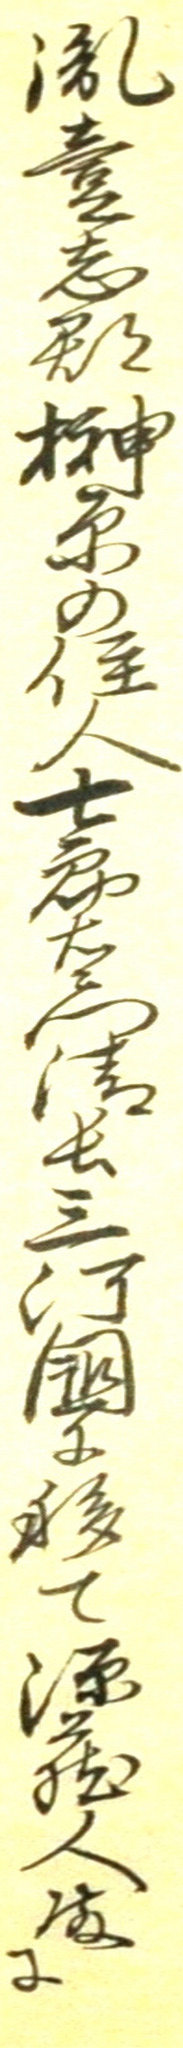胤一志郡榊原の住人七郎右衛門清長三河国に移てげ源蔵人殿に
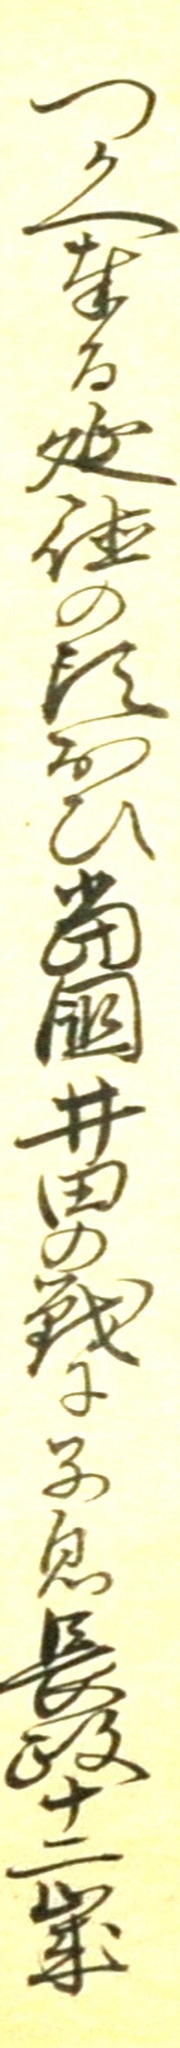つかへ奉る延徳の頃おひ当国井田の戦に子息長政十二歳
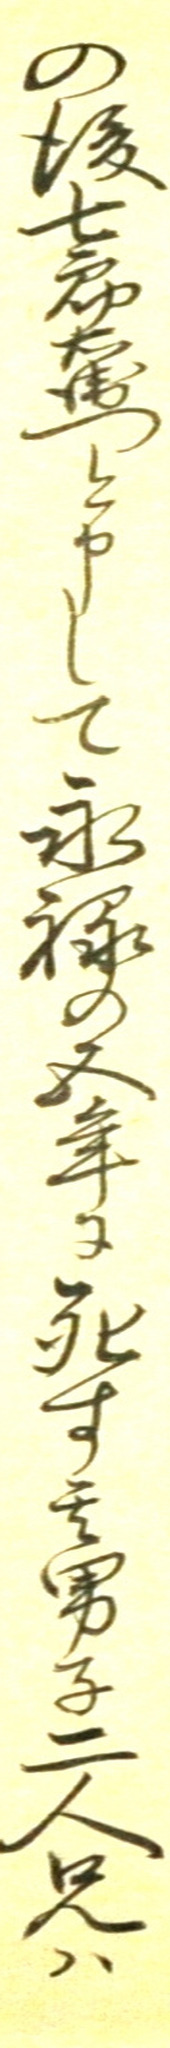の後七郎右衛門と申して永禄の五年に死す其男子二人兄は
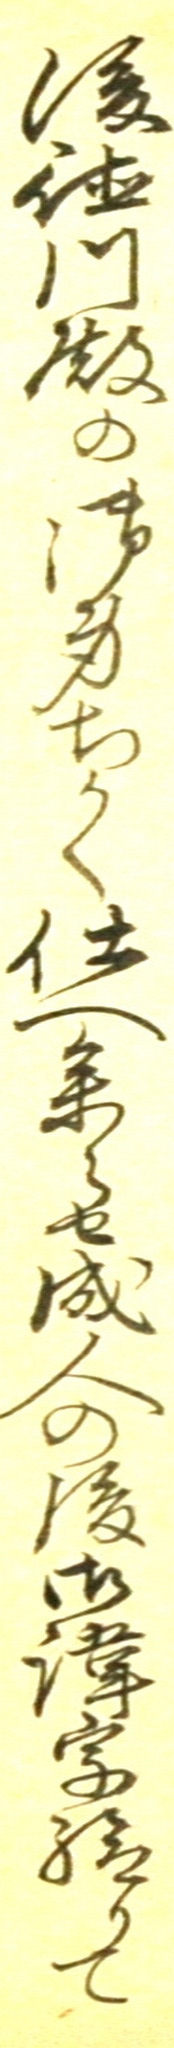後徳川殿の御身ちかく仕へ参らせ成人の後御諱字給りて
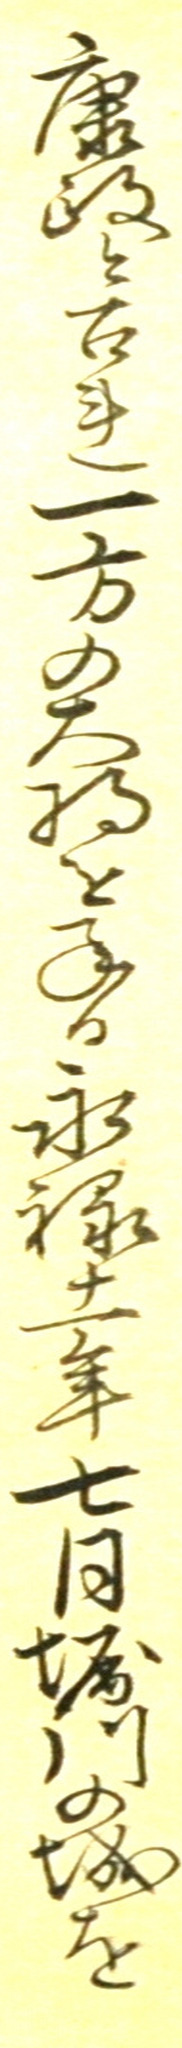康政と召れ一方の大将を承る永禄十一年七月堀川の城を

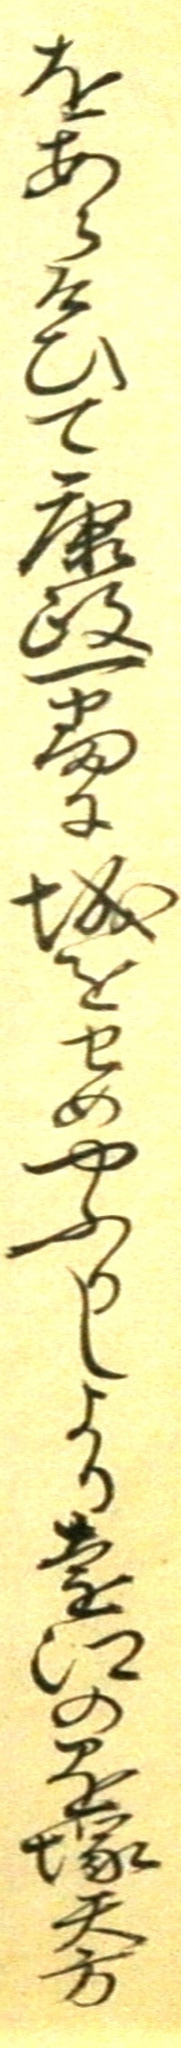をあらそひて康政一番に城をせめやふりしより遠江の懸塚天方
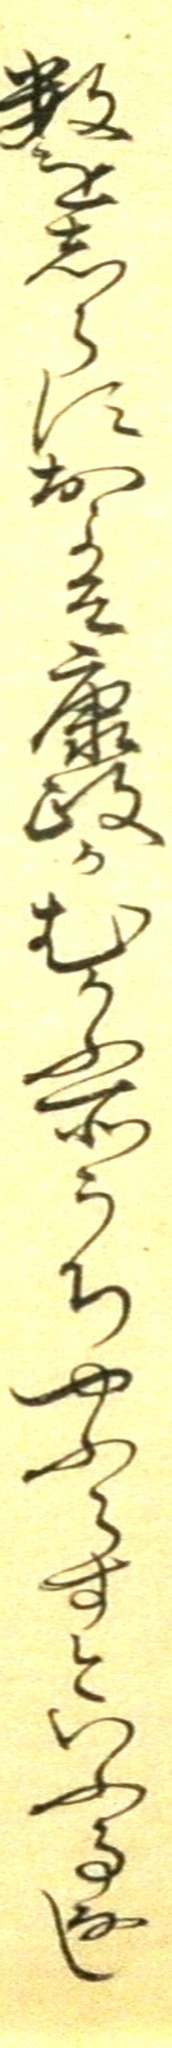数をしらすおよそ康政かむかう所うちやふらすといふ事なし
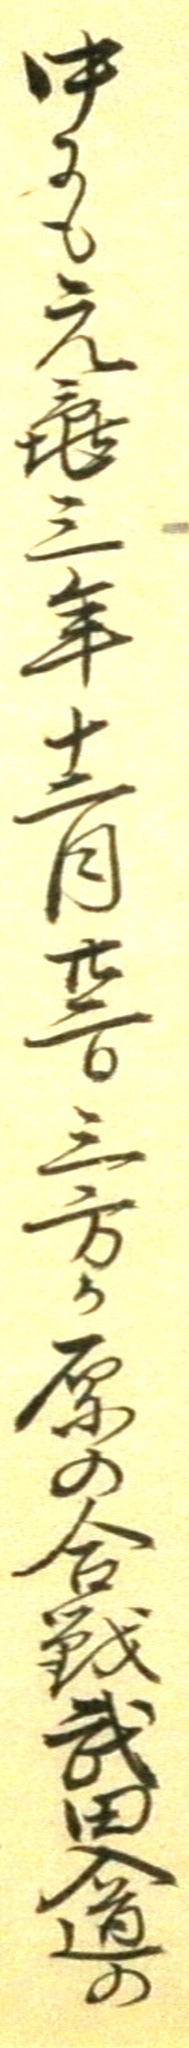中にも元亀三年十二月廿二日三方か原の合戦武田入道の
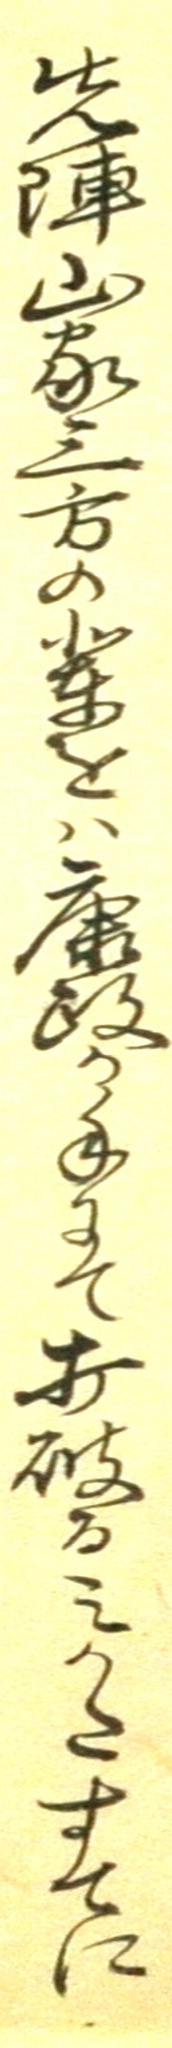先陣山家三方の輩をは康政か手にて打破るみかたすてに
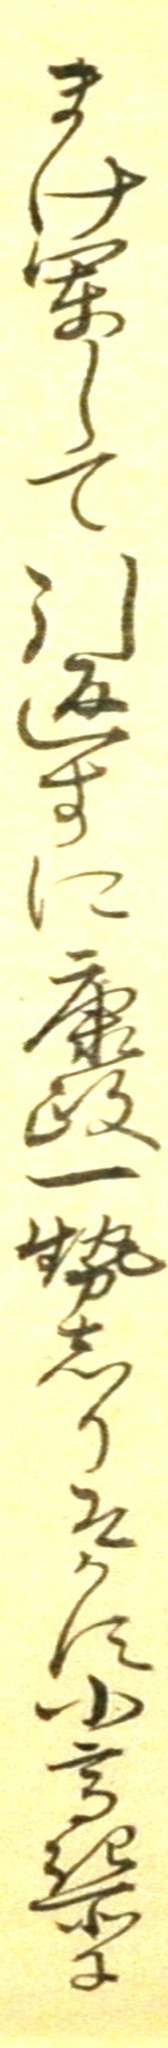まけ軍して引返すに康政一勢しりそかす小高き所に
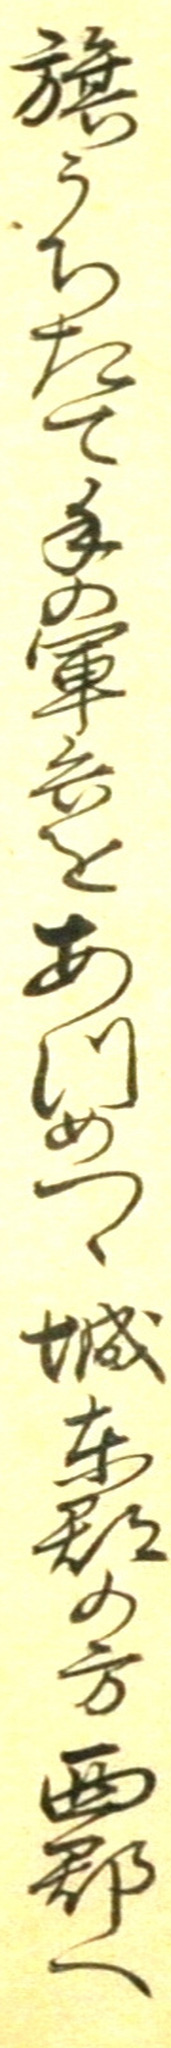旗をうちたて手の軍兵をあつめつゝ城東郡の方西郡へ
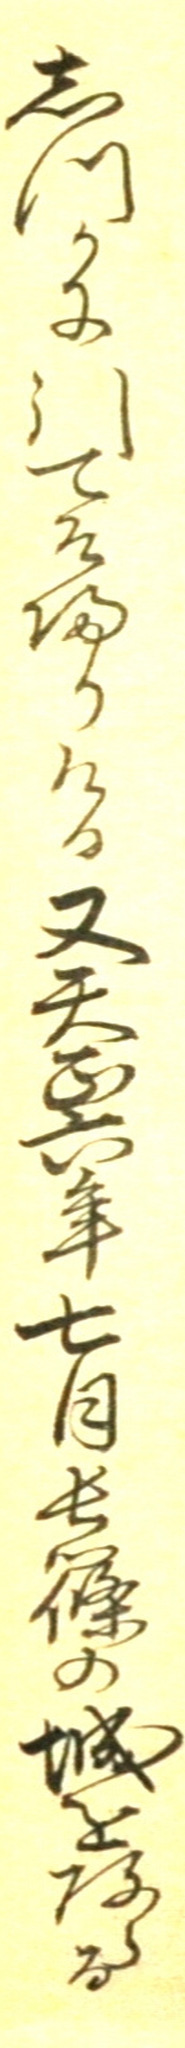しつかに引てそ帰りける又天正六年七月長篠の城を攻らる
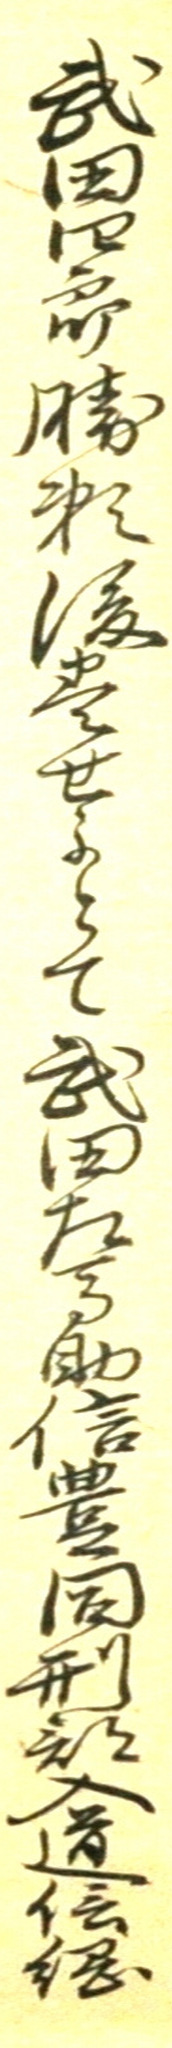武田四郎勝頼後巻せよとて武田左馬助信豊同刑部入道信綱
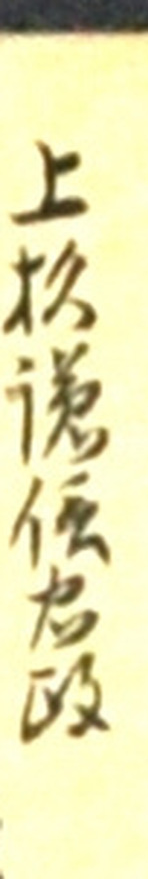上杉謙信忠政
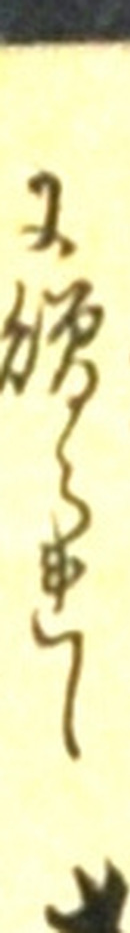に贈られし
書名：藩翰譜（四・上）
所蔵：伊那市立高遠町図書館・合同会社AMANE
